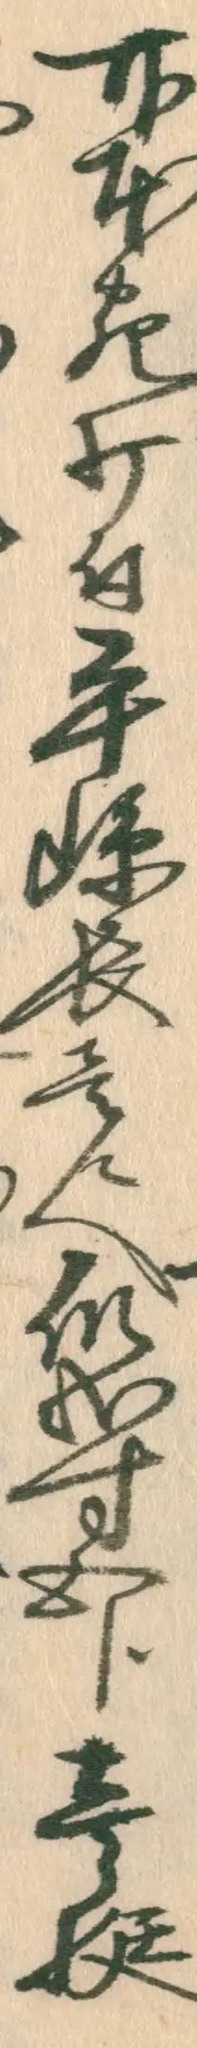廿本宛打付平鎹長壱尺爪弐寸五分壱挺
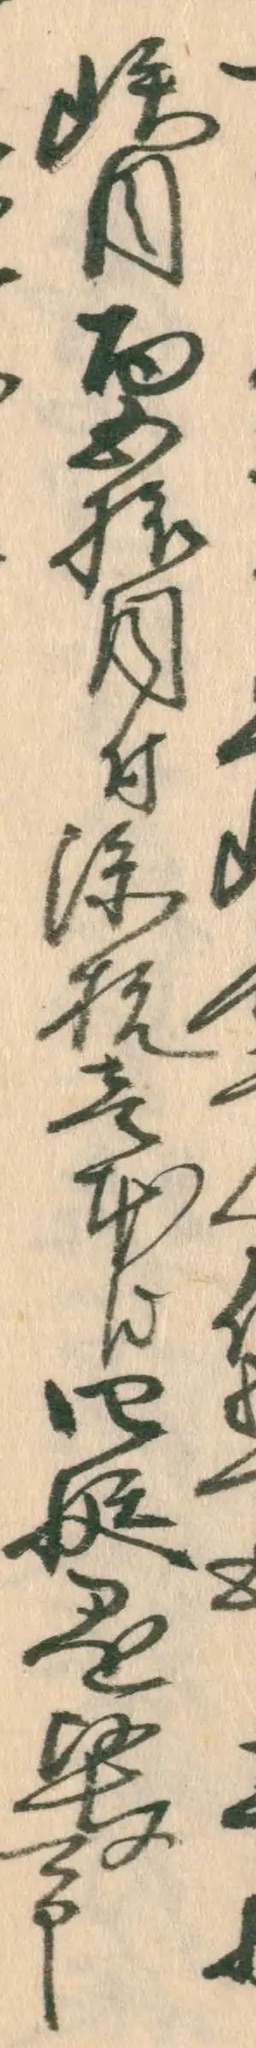鉄目百五拾目付添杭壱本え四挺懸堅メ可申
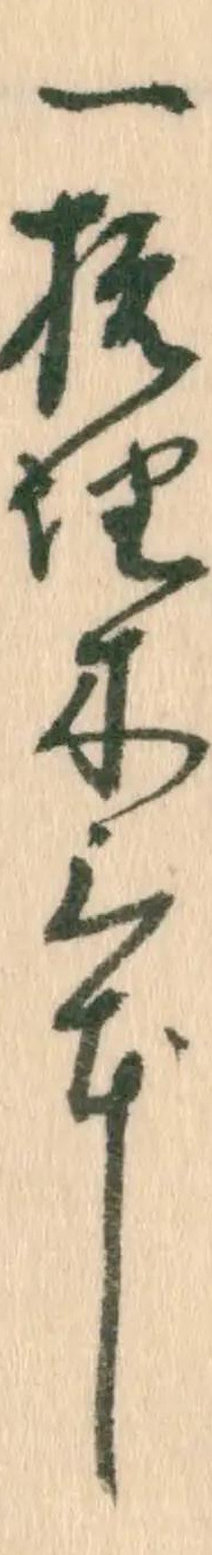一杭埋木三本
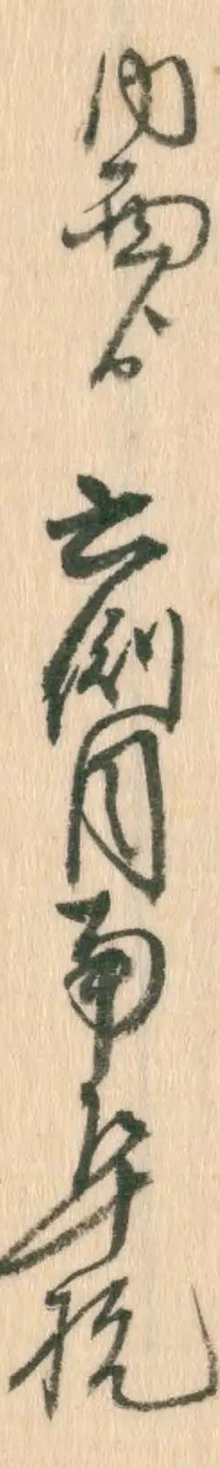内西ゟ六側目南耳杭
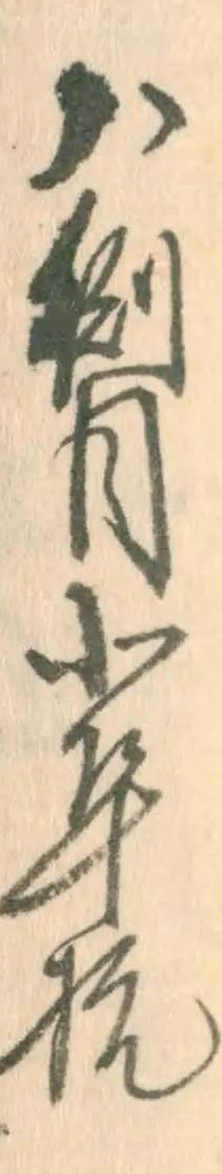八側目北耳杭
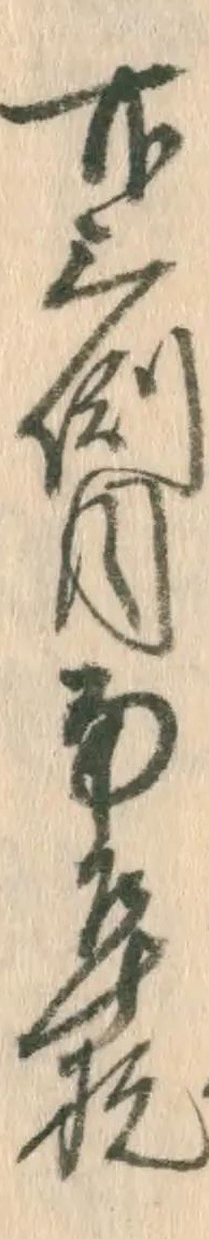廿三側目南耳杭
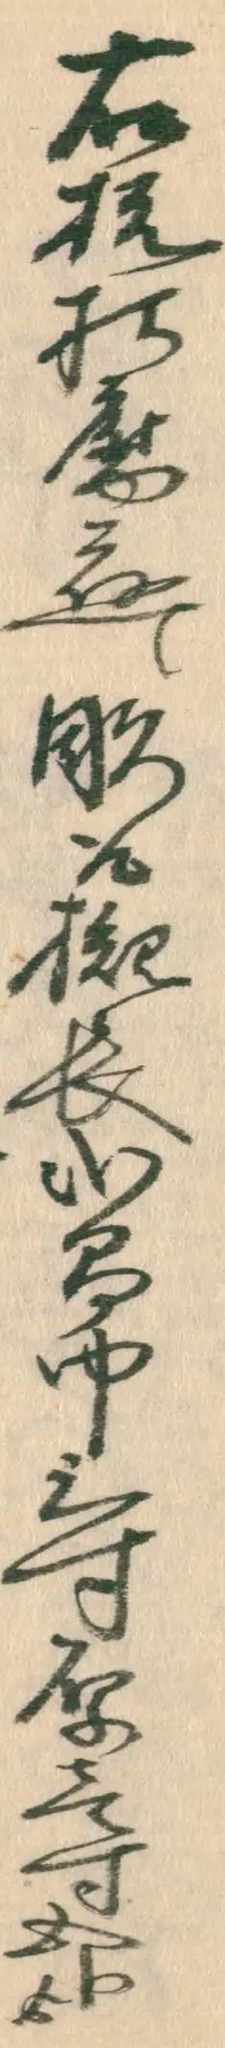右杭朽腐応し彫取槻長弐間巾三寸厚壱寸五分ゟ
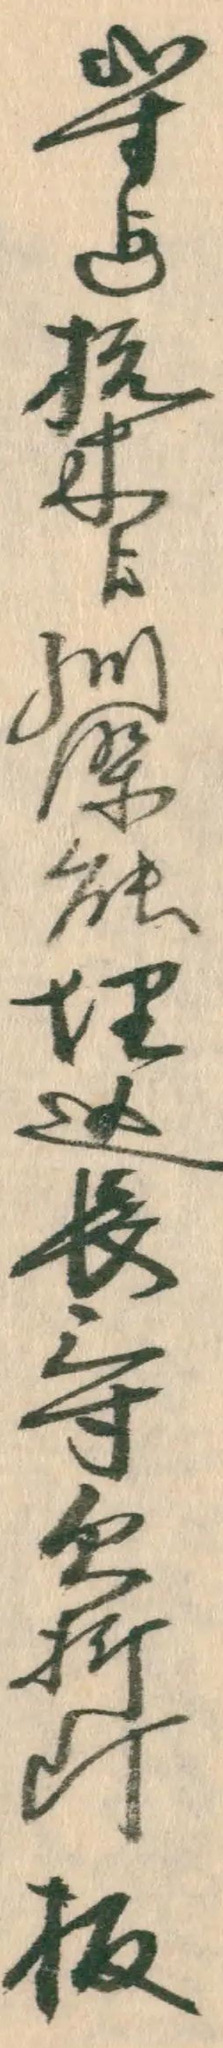弐寸迄杭木え馴染能埋込長三寸欠折釘板
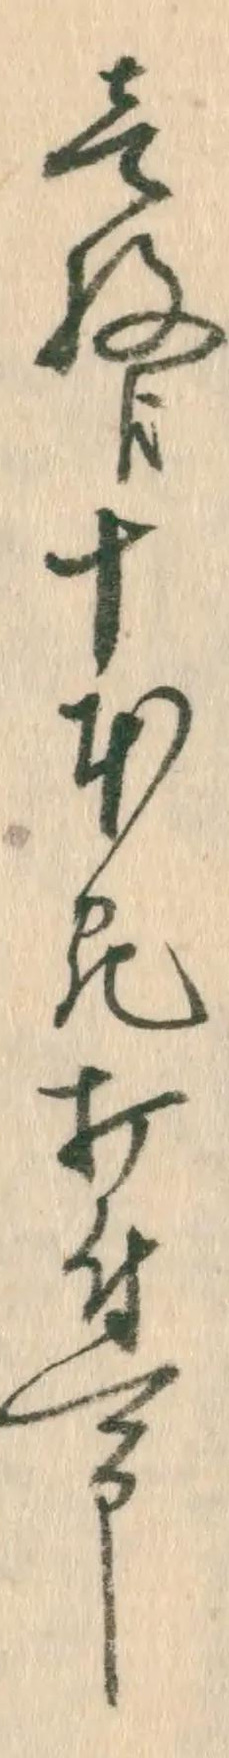壱枚え十本宛打付可申
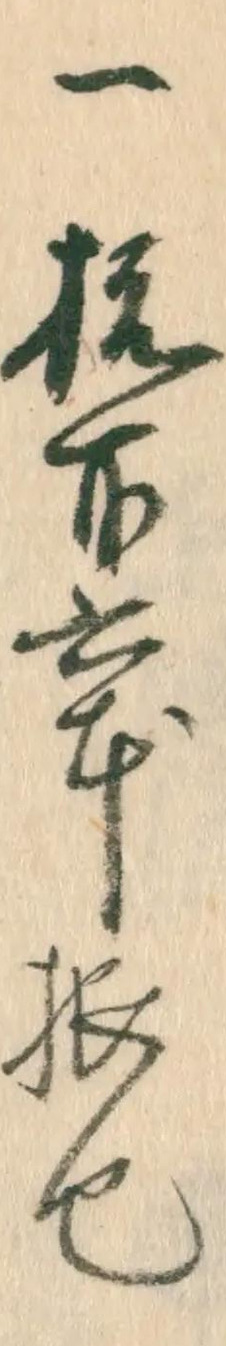一杭廿六本根包
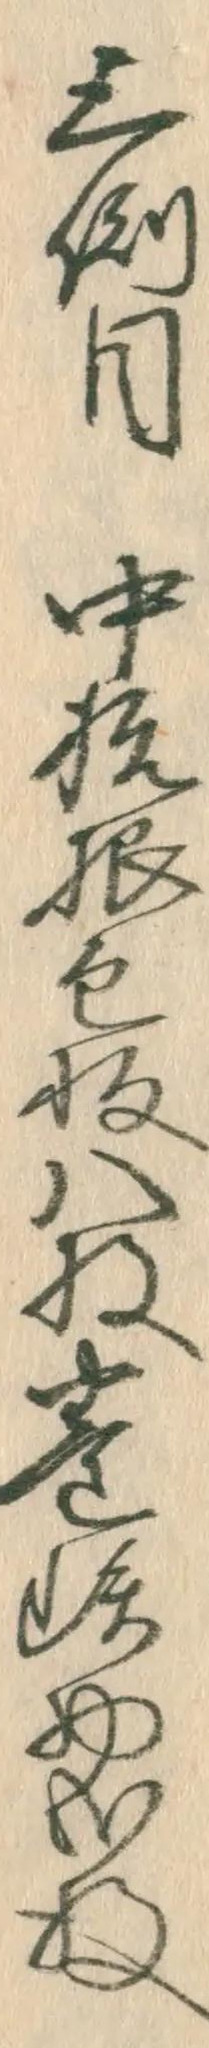三側目中杭根包板八枚巻鉄物弐枚

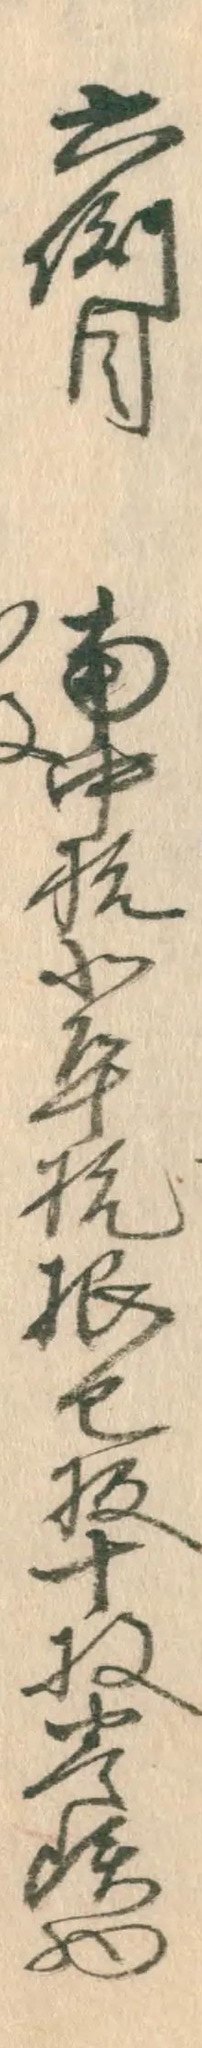六側目南中杭北耳杭根包板十枚巻鉄物
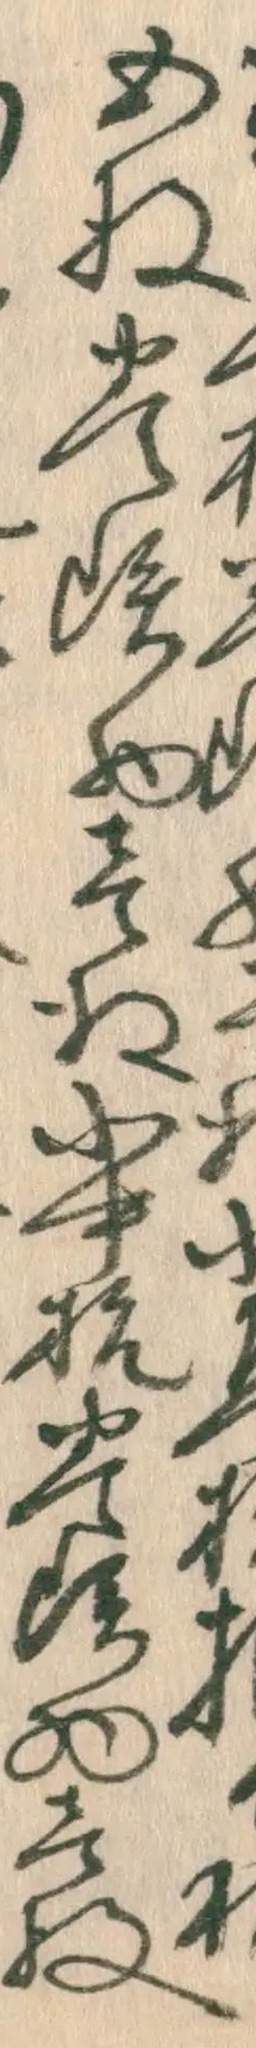五枚巻鉄物壱枚北中杭巻鉄物壱枚
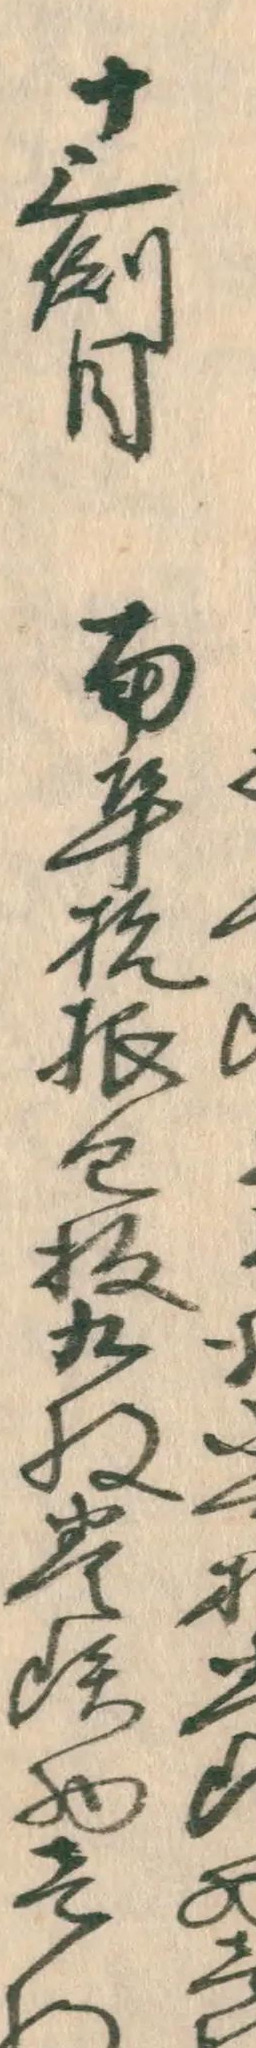十三側目南耳杭根包板九枚巻鉄物壱枚
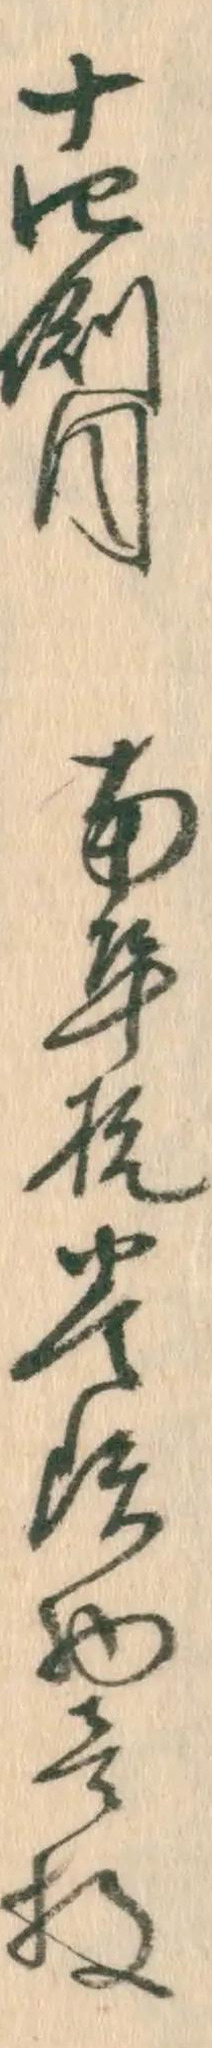十四側目南耳杭巻鉄物壱枚
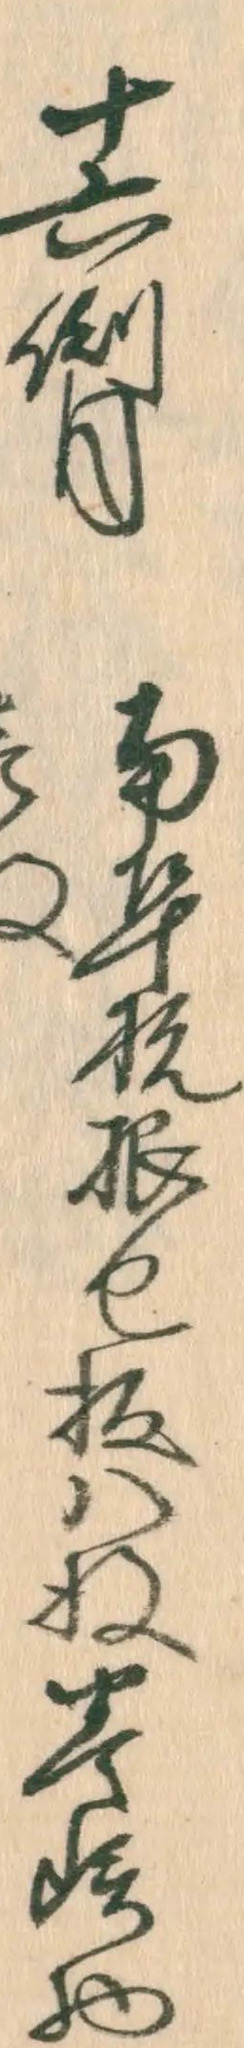十六側目南耳杭根包板八枚巻鉄物
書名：三橋 17巻. [8] 三橋小破御修復書留　但御奉行御掛リ替地震潰橋番屋　嘉永四亥年より安政二卯年迄　下
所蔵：国立国会図書館 National Diet Library, JAPAN
